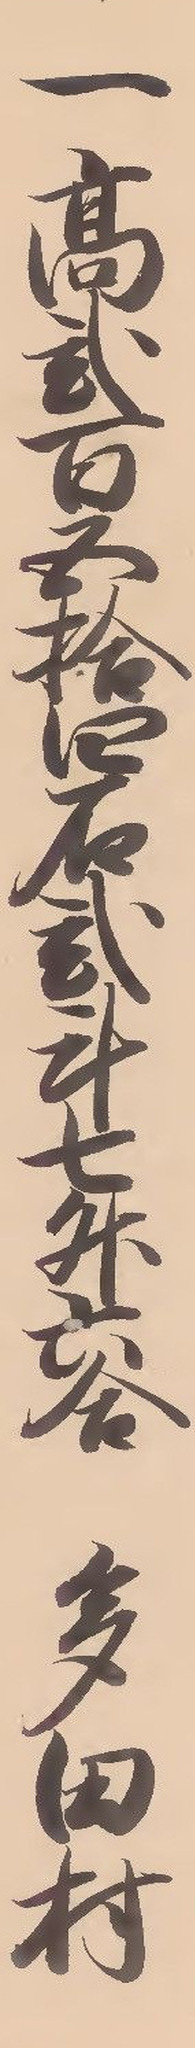一高弐百五拾四石弐斗七升六合多田村

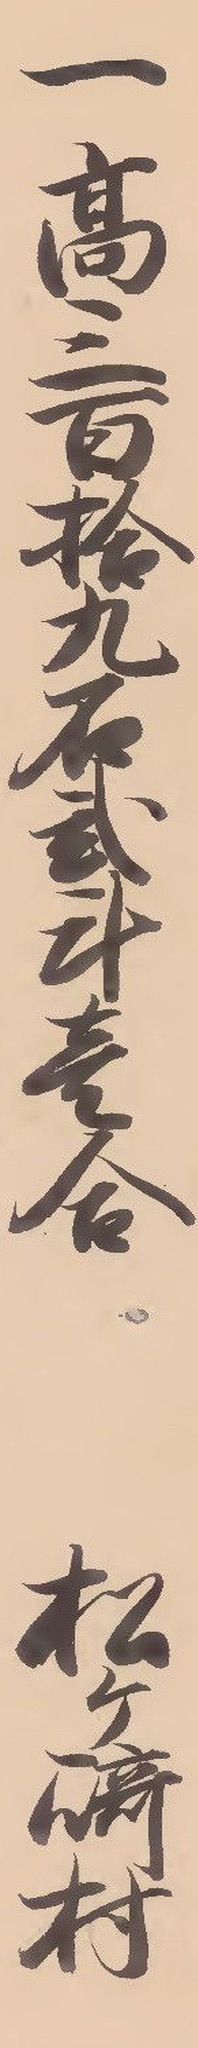一高三百拾九石弐斗壱合松ヶ崎村
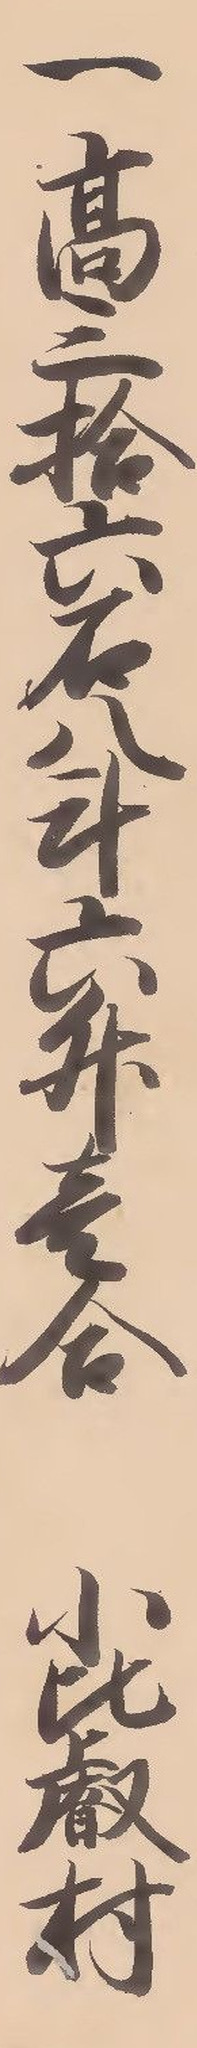一高三拾六石八斗六升壱合小比叡村
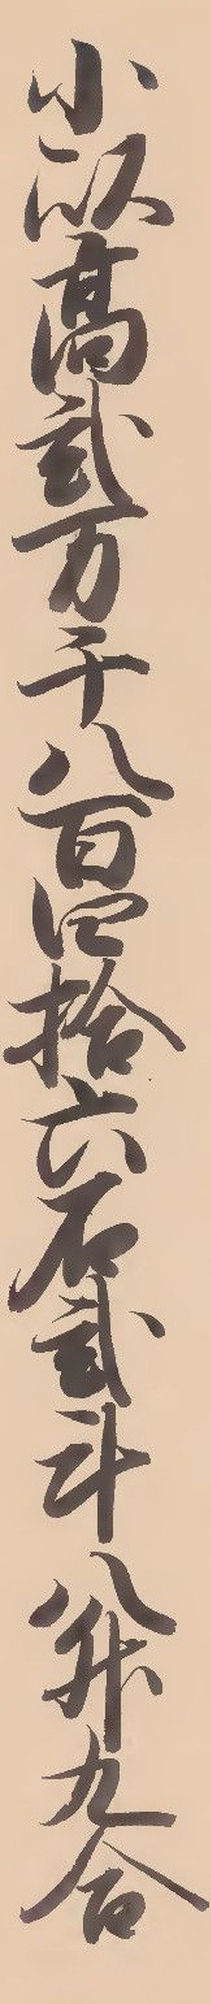小以高弐万千八百四拾六石弐斗八升九合
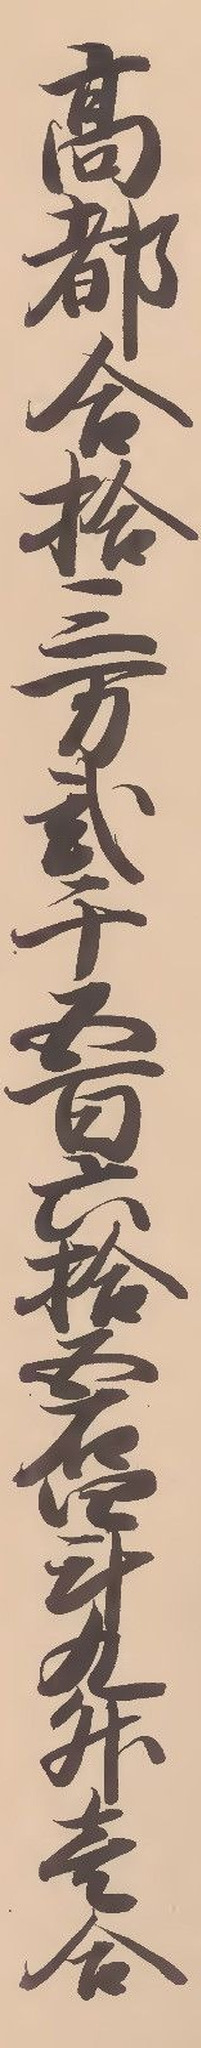高都合拾三万弐千五百六拾五石四斗九升壱合
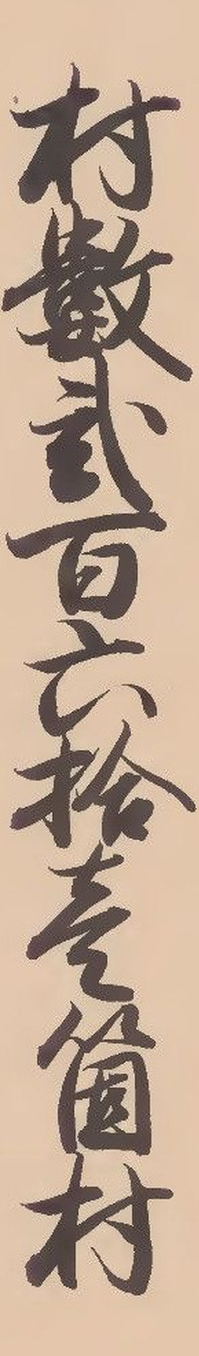村数弐百六拾壱箇村

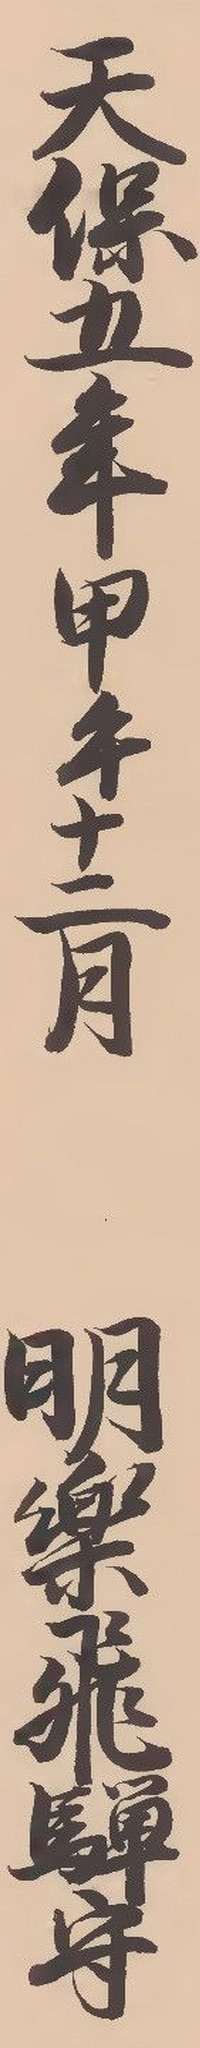天保五年甲午十二月明楽飛騨守
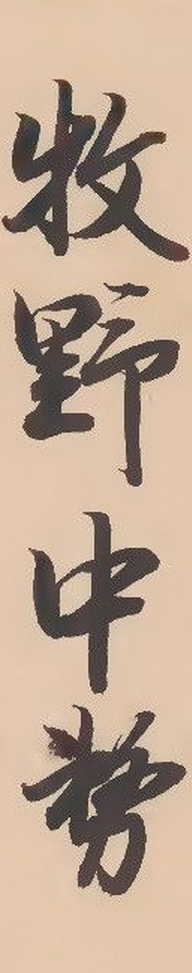牧野中務
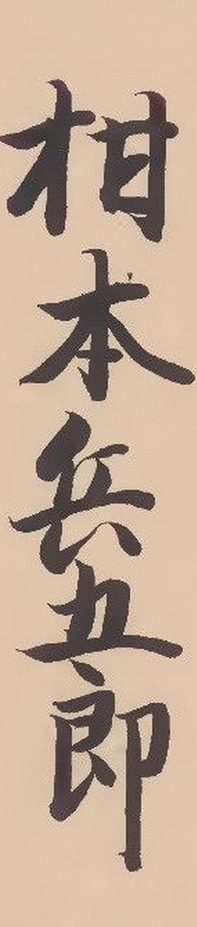柑本兵五郎
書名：佐渡国郷帳
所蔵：国立公文書館 National Archives of Japan
